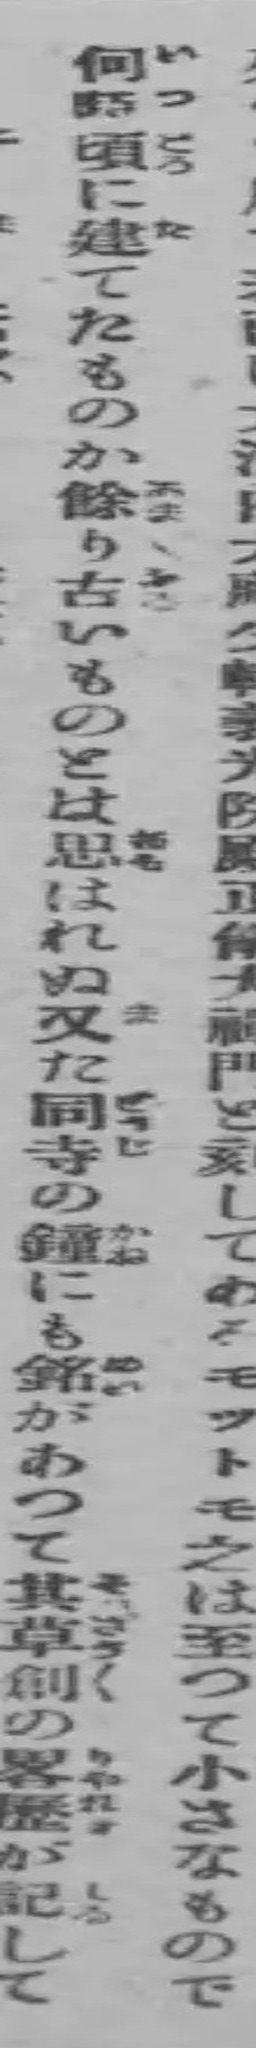何時頃に建てたものか余り古いものとは思はれぬ又た同寺の鐘にも銘があつて其草創の略歴が記して
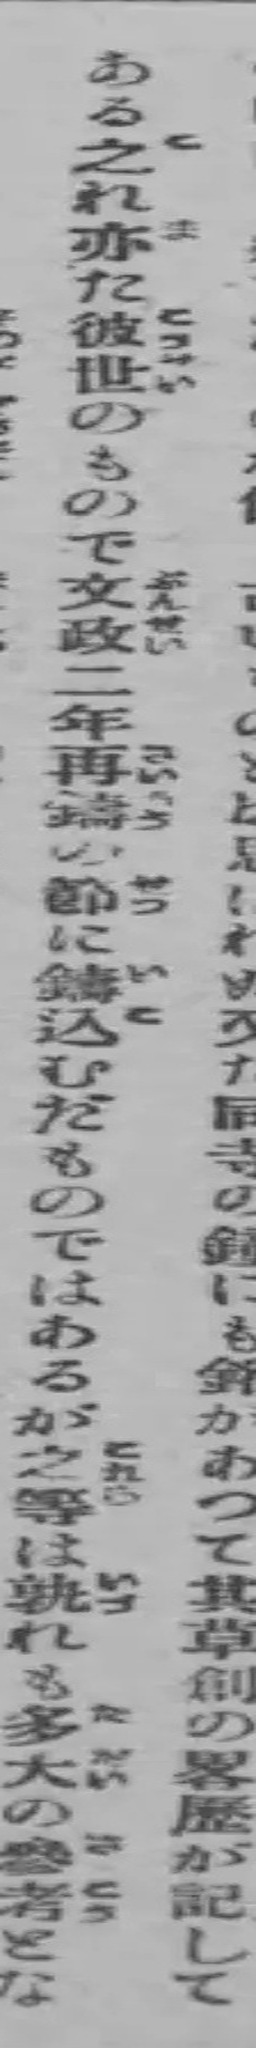ある之れ亦た後世のもので文政二年再鋳の節に鋳込むだものではあるが之等は孰れも多大の参考とな
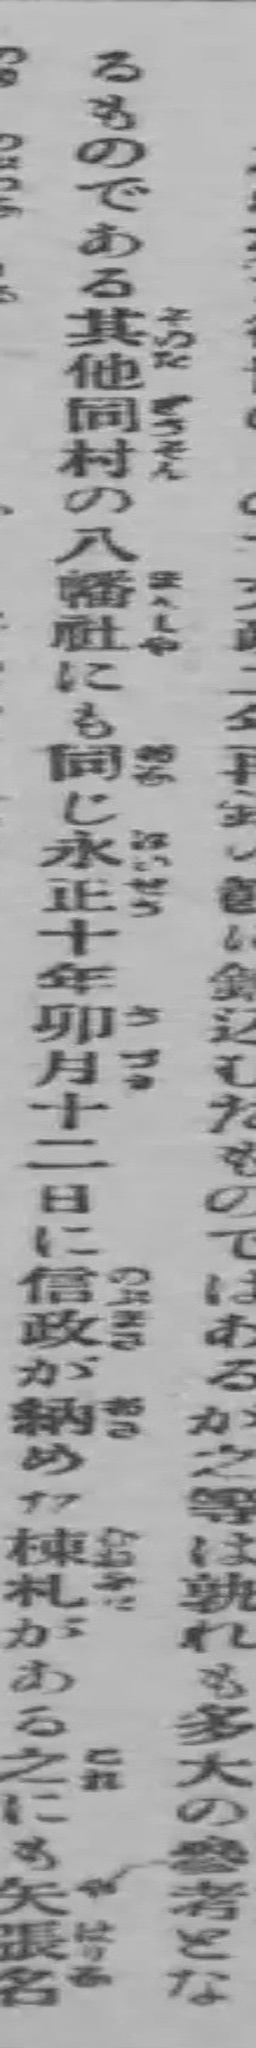るものである其他同村の八幡社にも同じ永正十年卯月十二日に信政が納めた棟札がある之にも矢張名
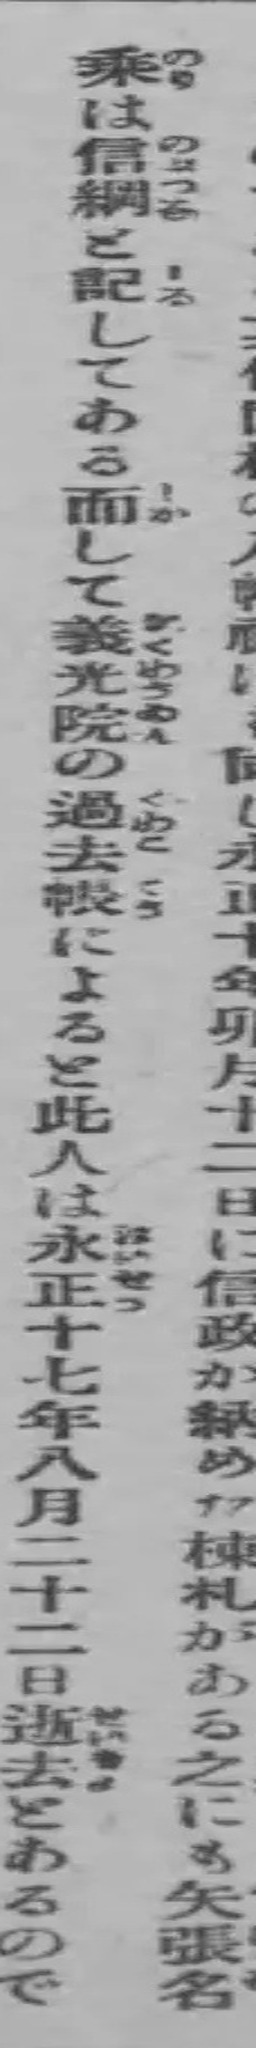乗は信綱と記してある而して義光院の過去帳によると此人は永正十七年八月二十二日逝去とあるので
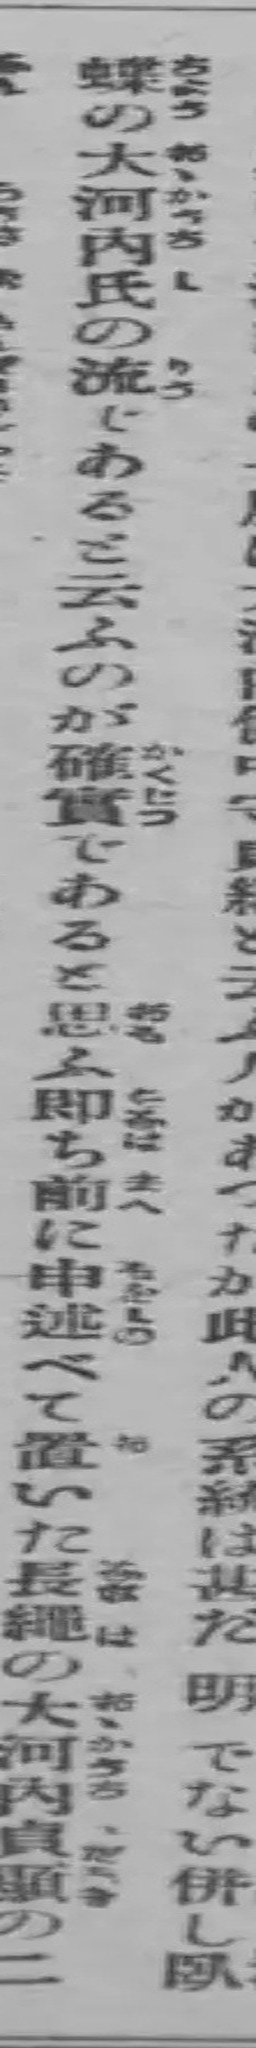蝶の大河内氏の流であると云ふのが確実であると思ふ即ち前に申述べて置いた長縄の大河内貞顕の二
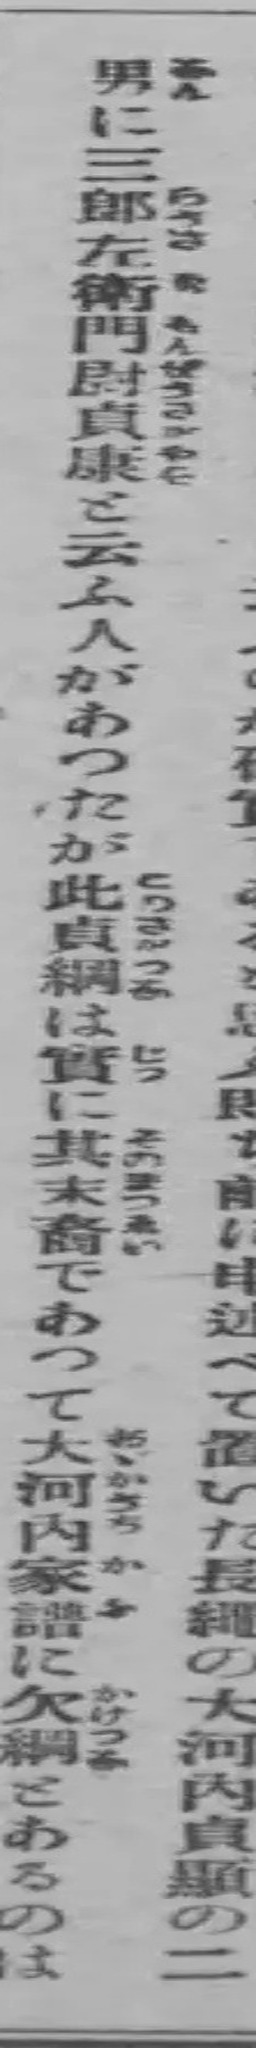男に三郎左衛門尉貞康と云ふ人があつたが此貞綱は実に其末裔であつて大河内家譜に欠綱とあるのは
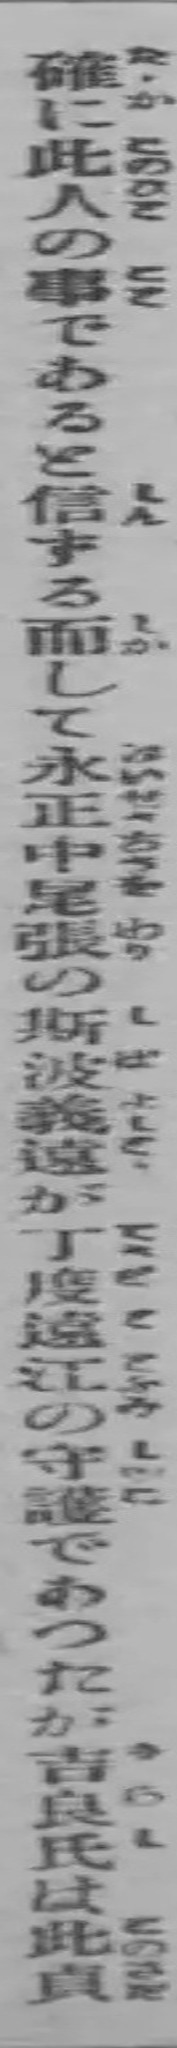確に此人の事であると信ずる而して永正中尾張の斯波義遠が丁度遠江の守護であつたが吉良氏は此貞
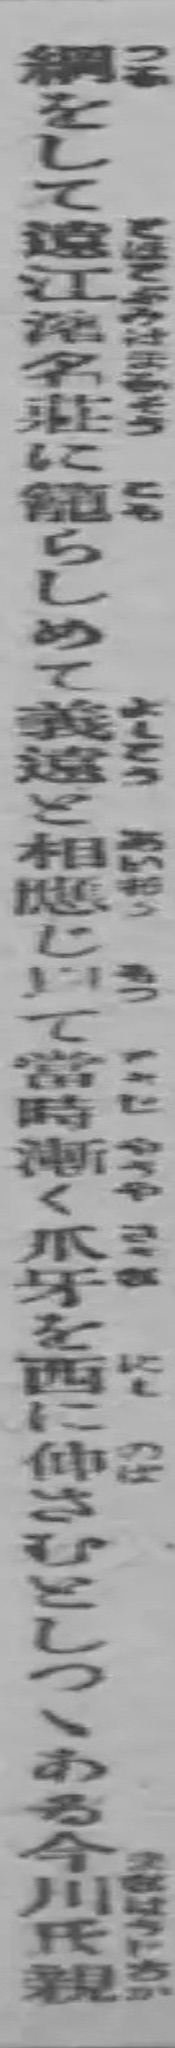綱をして遠江浜名荘に籠らしめて義遠と相応じ以て当時漸く爪芽を西に伸さむとしつゝある今川氏親
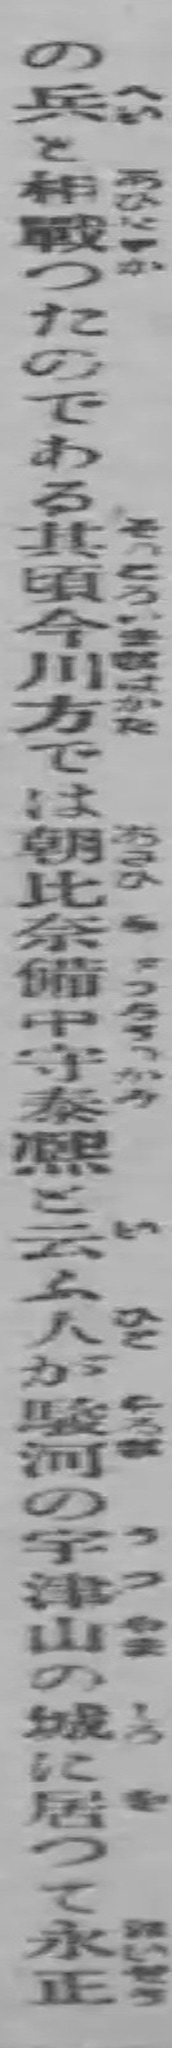の兵と相戦つたのである其頃今川方では朝比奈備中守泰凞と云ふ人が駿河の宇津山の城に居つて永正
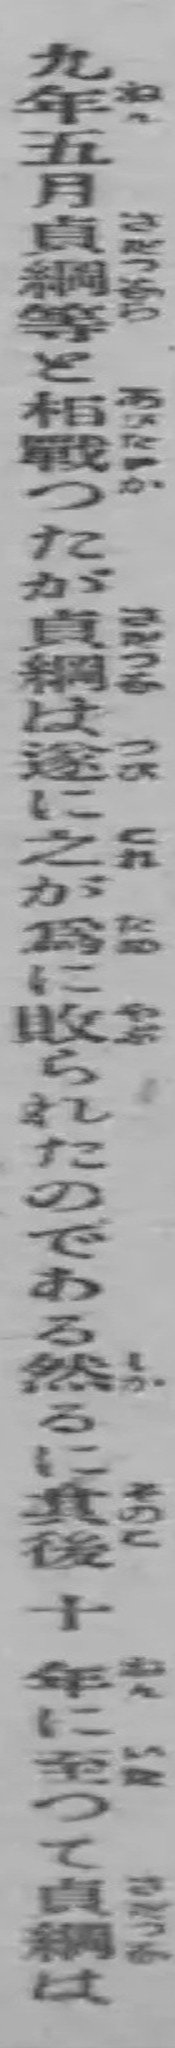九年五月貞綱等と相戦つたが貞綱は遂に之が為に敗られたのである然るに其後十年に至つて貞綱は
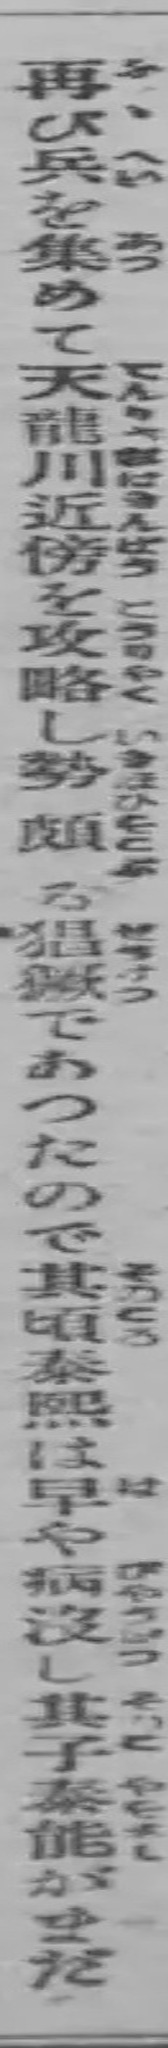再び兵を集めて天龍川近傍を攻略し勢頗る猖獗であつたので其頃泰凞は早や病没し其子泰能がまだ
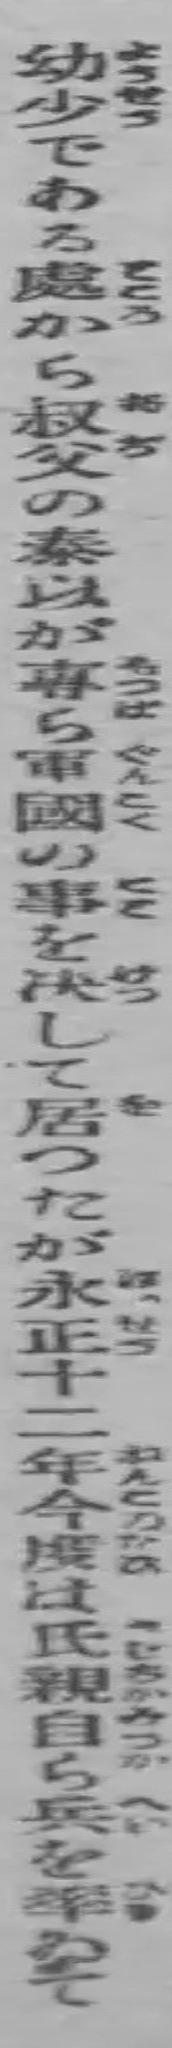幼少である処から叔父の泰以が専ら軍国の事を決して居つたが永正十二年今度は氏親自ら兵を率ゐて
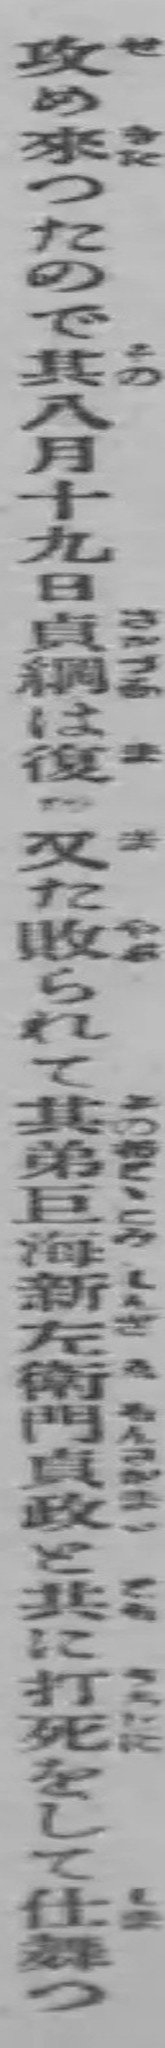攻め来つたので其八月十九日貞綱は復た又た敗られて其弟巨海新左衛門貞政と共に打死をして仕舞つ
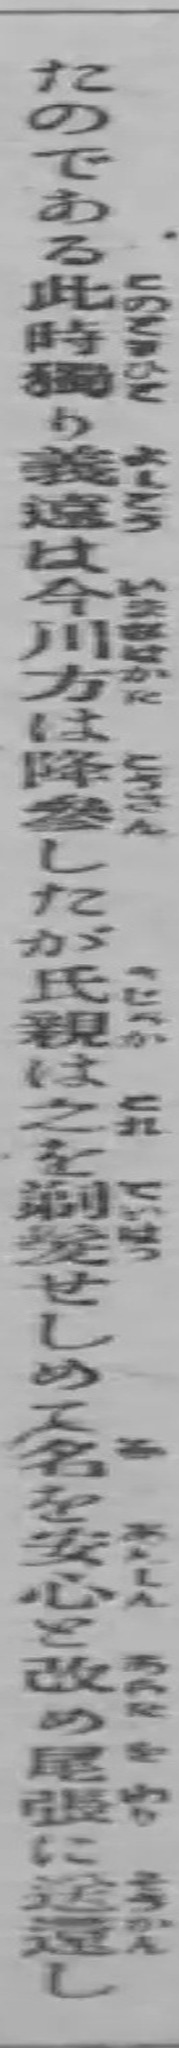たのである此時独り義遠は今川方に降参したが氏親は之を剃髪せしめて名を安心と改め尾張に送還し
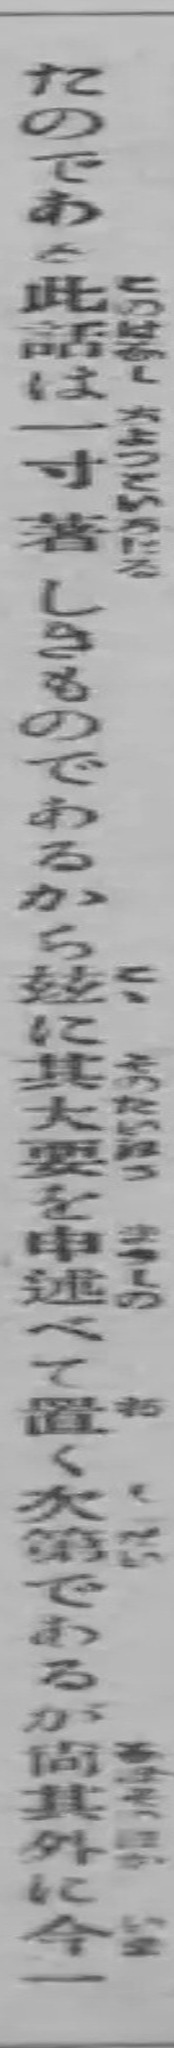たのである此話は一寸著しきものであるから茲に其大要を申述べて置く次第であるが尚其外に今一
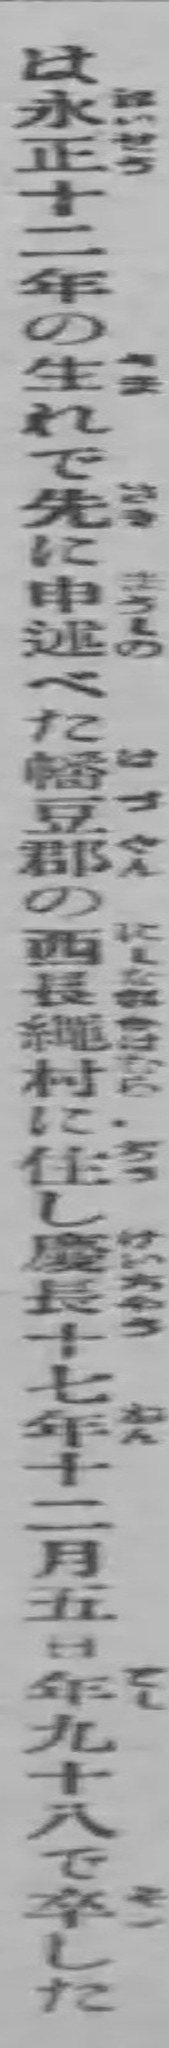大河内基孝は永正十二年の生れで先に申述べた幡豆郡の西長縄村に住し慶長十七年十二月五日年九十八で卒した
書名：豊橋市史談
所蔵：国立国会図書館 National Diet Library, JAPAN
